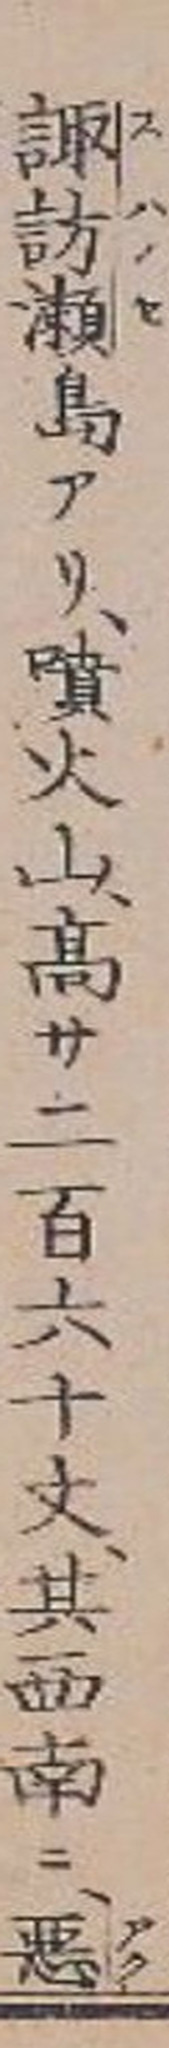諏訪瀬島アリ、噴火山、高サ二百六十丈、其西南ニ、悪
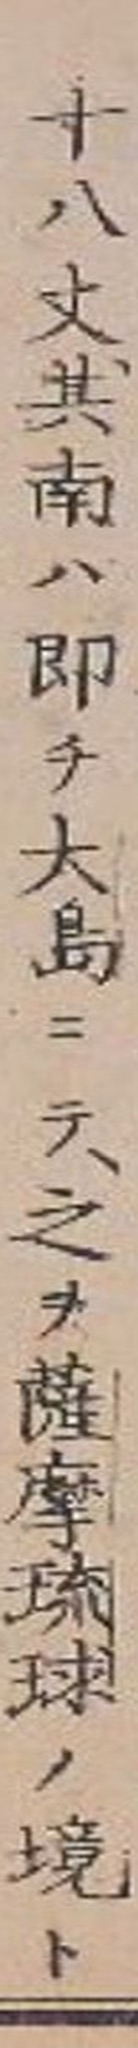十八丈、其南ハ即チ大島ニテ、之ヲ薩摩琉球ノ境ト
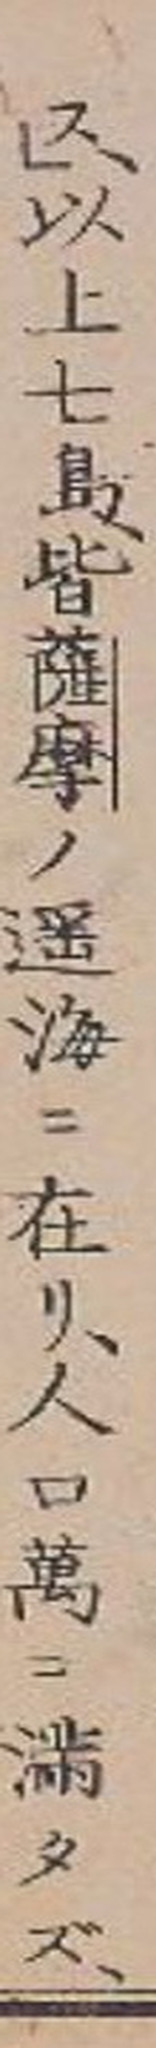ス、」以上七島、皆薩摩ノ遥海ニ在リ、人口万ニ満タズ、
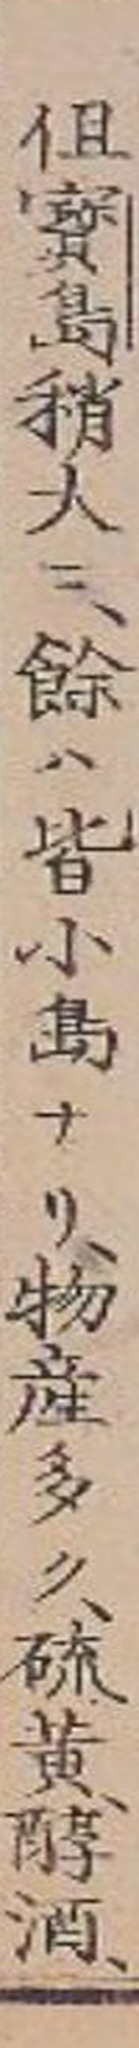但宝島稍大ニ、余ハ皆小島ナリ、物産多ク、硫黄、醇酒、
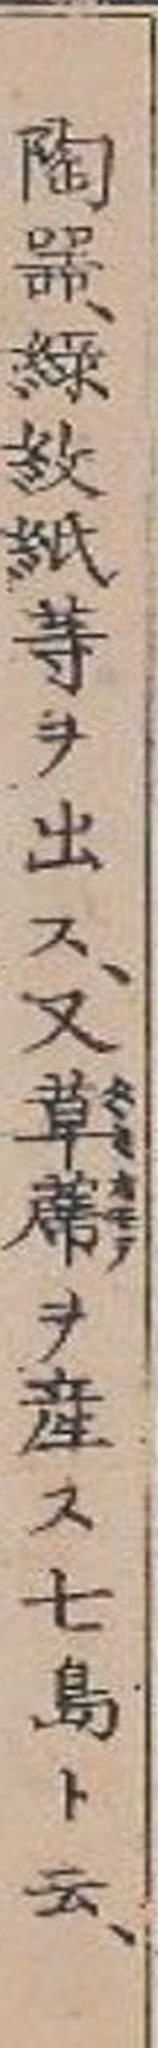陶器、緑紋紙等ヲ出ス、又草蓆ヲ産ス七島ト云、
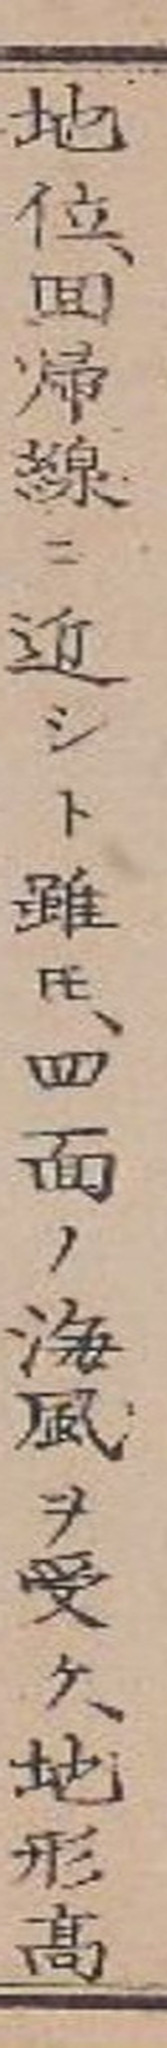地位、回帰線ニ近シト雖トモ、四面ノ海風ヲ受ケ、地形高
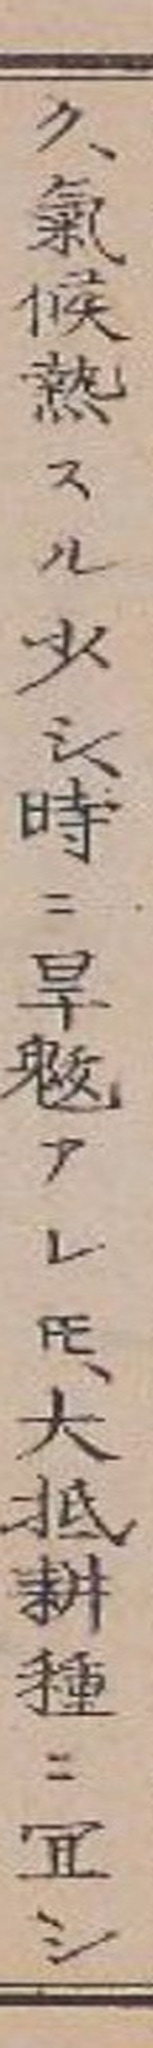ク、気候熱スル少シ、時ニ旱魃アレトモ、大抵耕種ニ宜シ
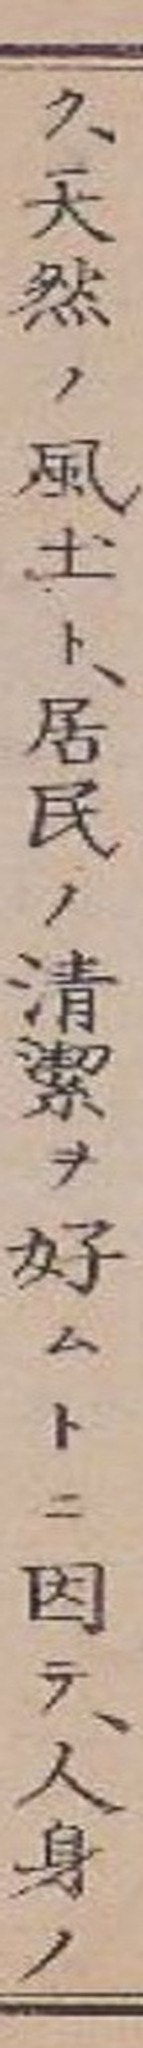ク、天然ノ風土ト、居民ノ清潔ヲ好ムトニ因テ、人身ノ
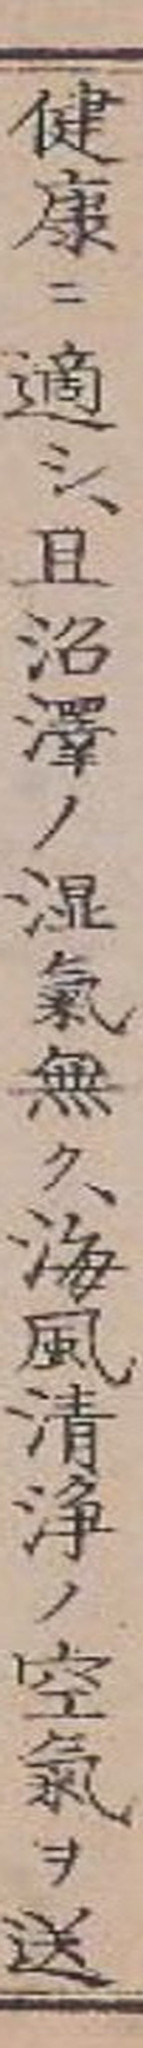健康ニ適シ、且沼沢ノ湿気無ク、海風清浄ノ空気ヲ送
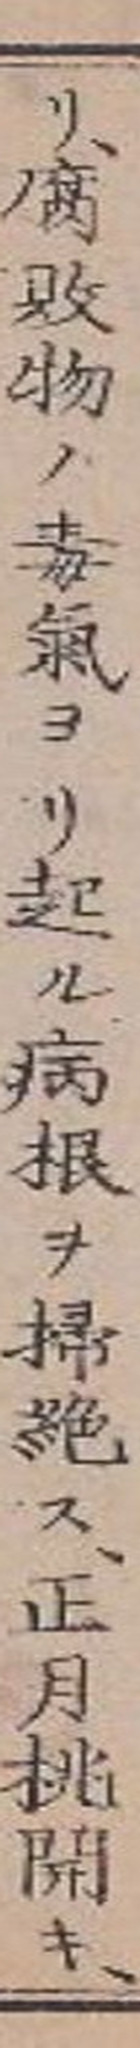リ、腐敗物ノ毒気ヨリ起ル病根ヲ掃絶ス、正月桃開キ、
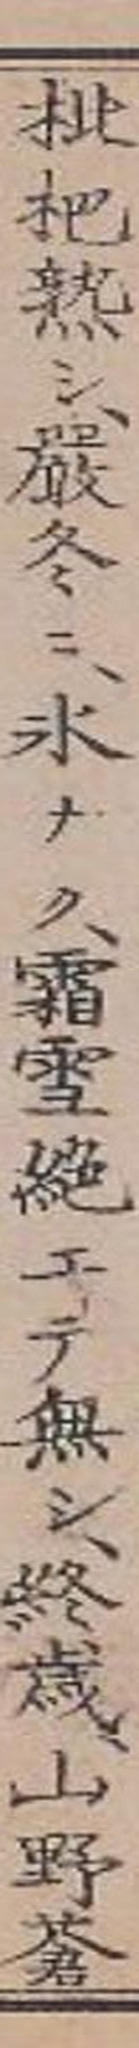枇杷熟シ、厳冬ニ、氷ナク、霜雪絶エテ無シ、終歳、山野蒼
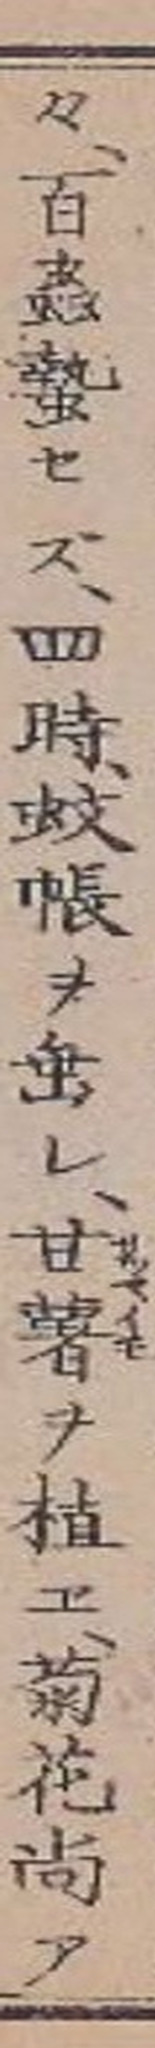々、百虫蟄セズ、四時、蚊帳ヲ垂レ、甘薯ヲ植ヱ、菊花尚ア
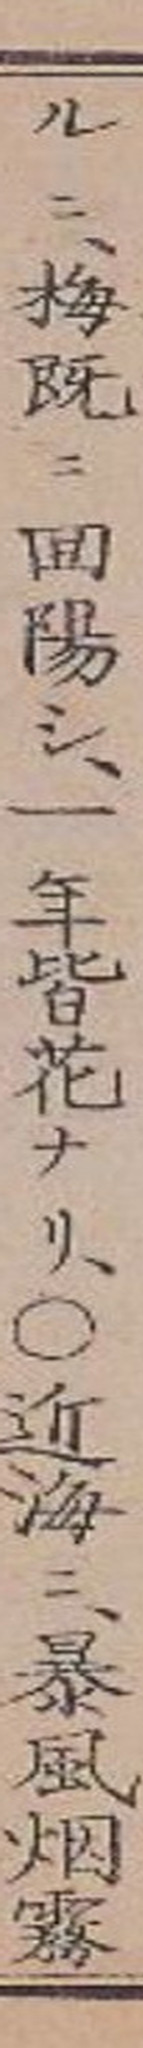ルニ、梅既ニ回陽シ、一年皆花ナリ、○近海ニ、暴風煙霧
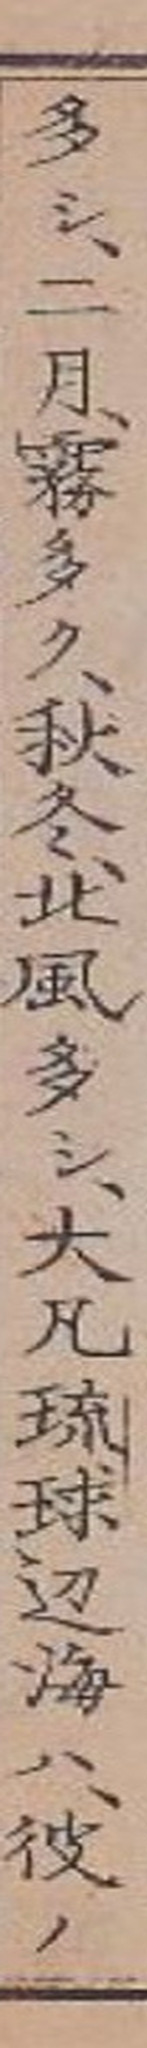多シ、二月、霧多ク、秋冬、北風多シ、大凡琉球辺海ハ、彼ノ

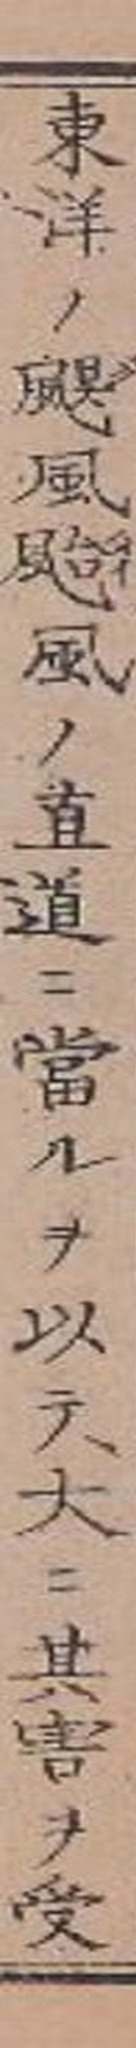東洋ノ颶風颱風ノ直道二当ルヲ以テ、大ニ其害ヲ受
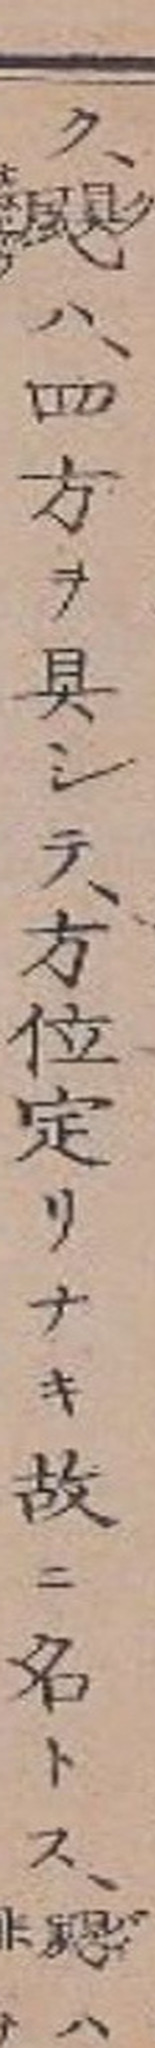ク、颶ハ、四方ヲ具シテ、方位定リナキ故ニ名トス、ハ非ナ
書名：琉球新誌 巻上
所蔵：University of the Ryukyus Library
